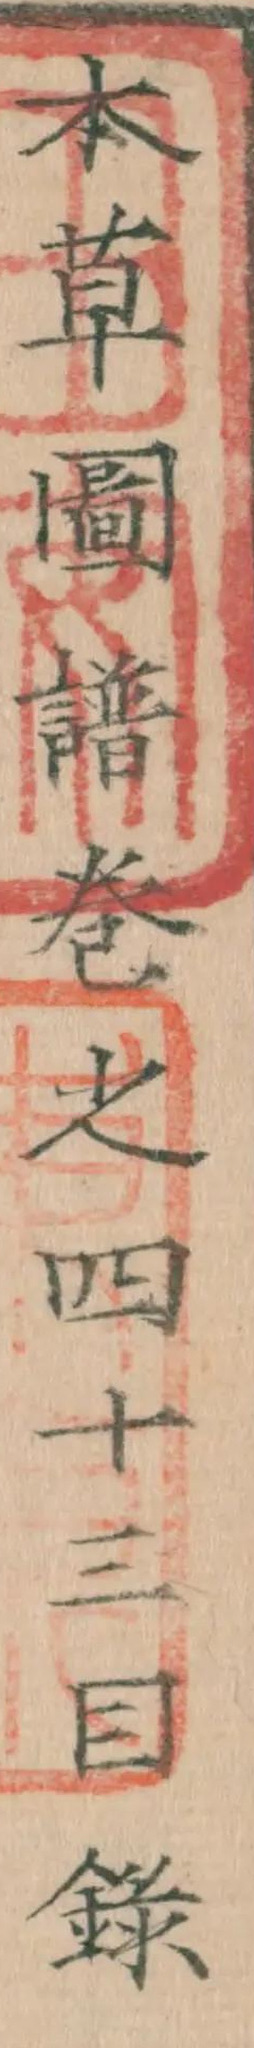本草図譜巻之四十三目録
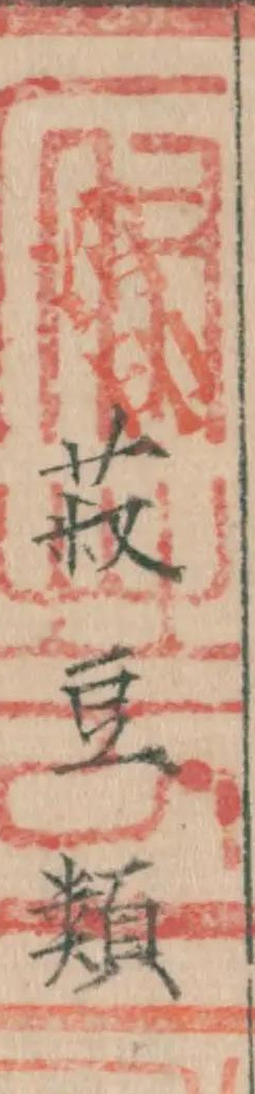菽豆類
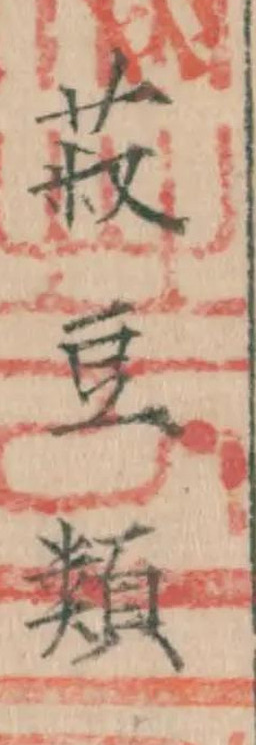菽豆類

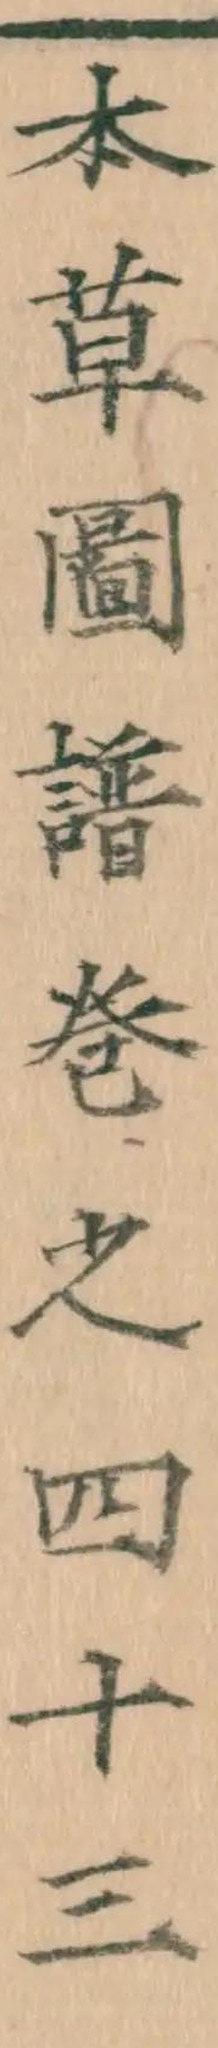本草図譜巻之四十三
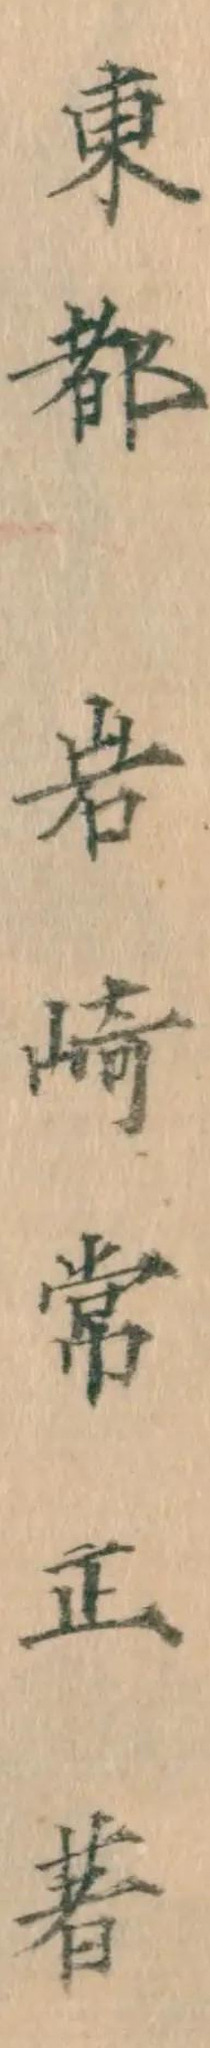東都岩崎常正著
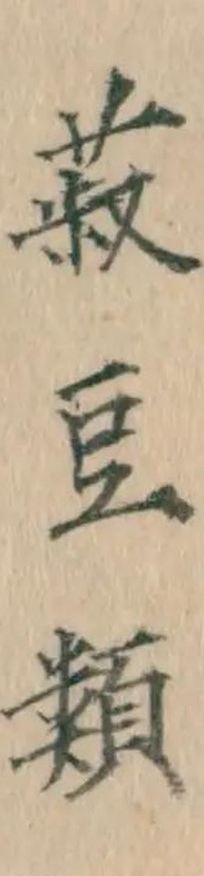菽豆類
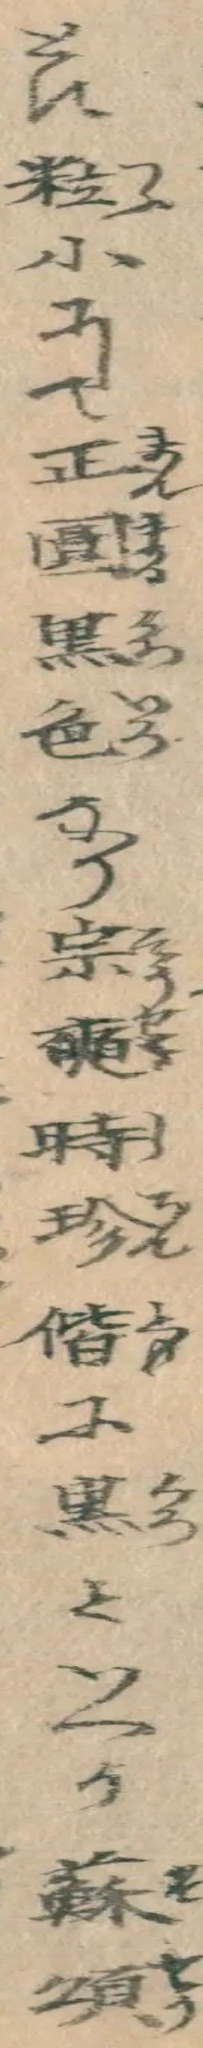とす粒小にして正円黒色なり宗奭時珍偕に黒といへり蘇頌
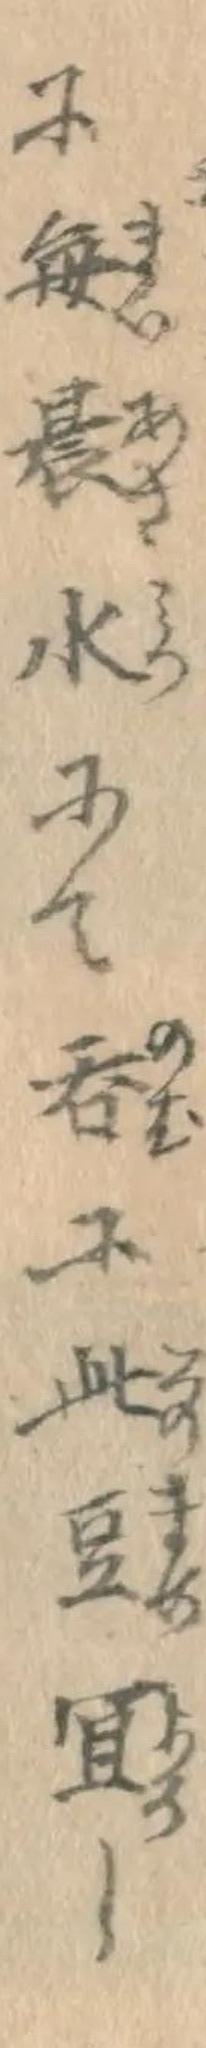に毎晨水にて呑に此豆宜し

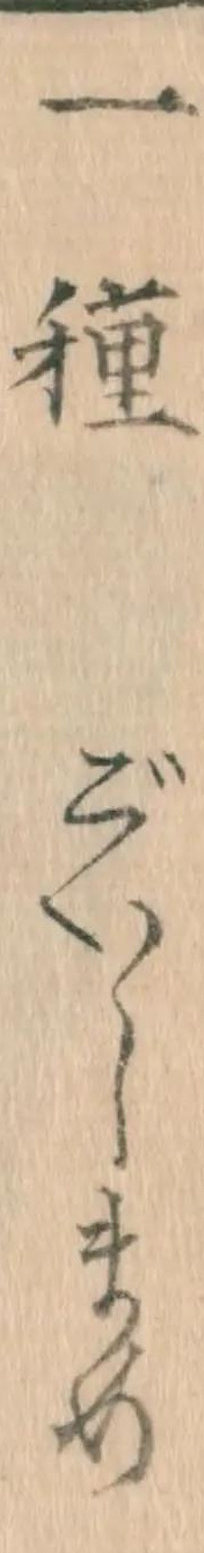一種ごいしまめ
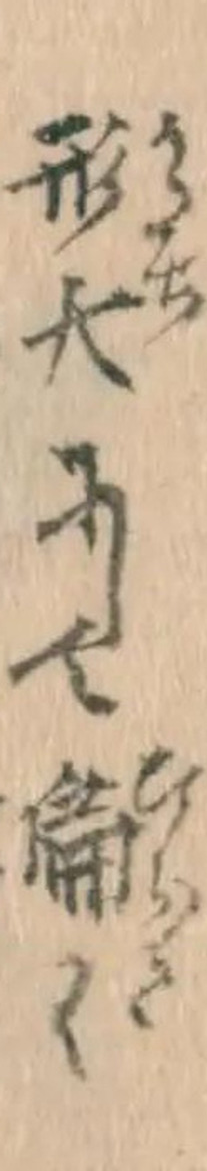形大にして扁く
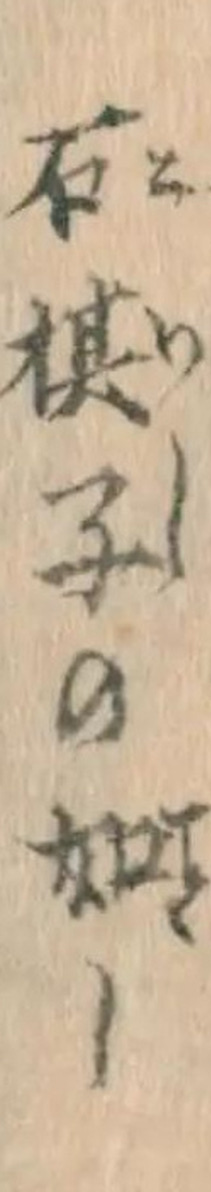石棋子の如し
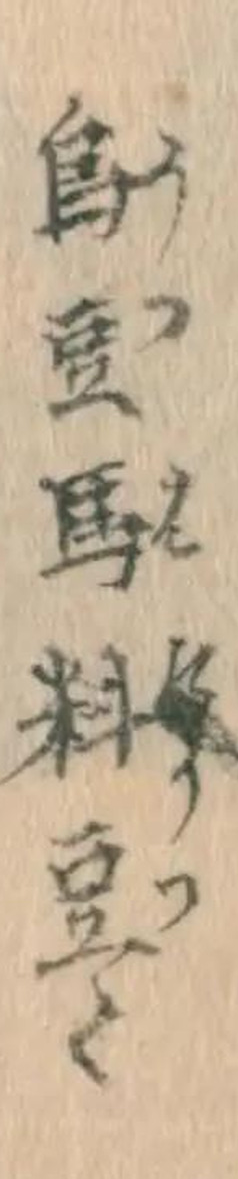烏豆馬料豆と
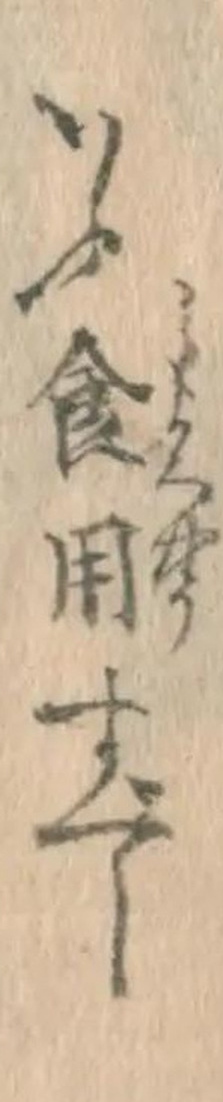いふ食用すべし

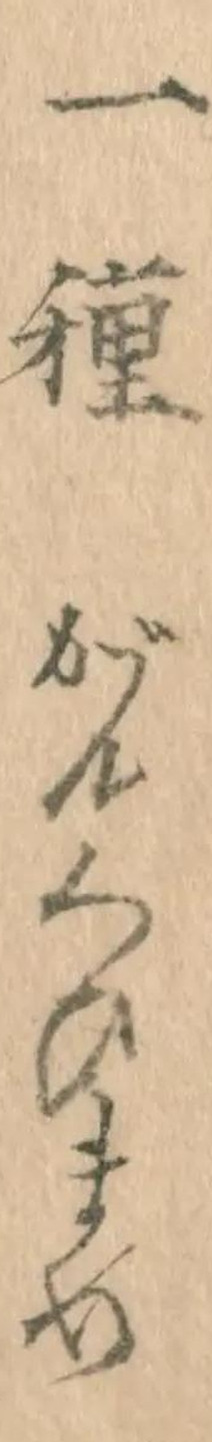一種がんくひまめ
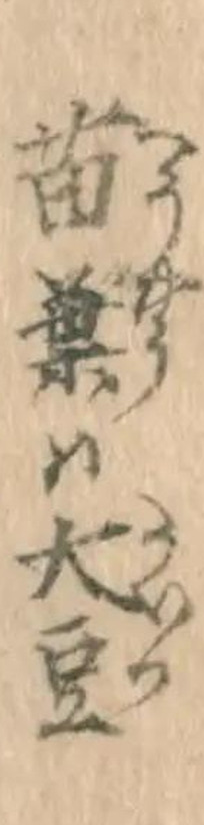苗葉は大豆
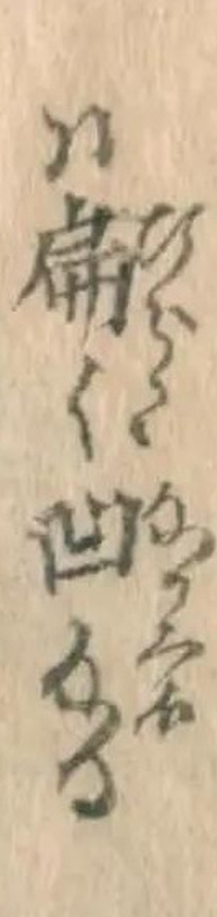は扁く凹なる
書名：本草図譜. 巻43-45
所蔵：国立国会図書館 National Diet Library, JAPAN
